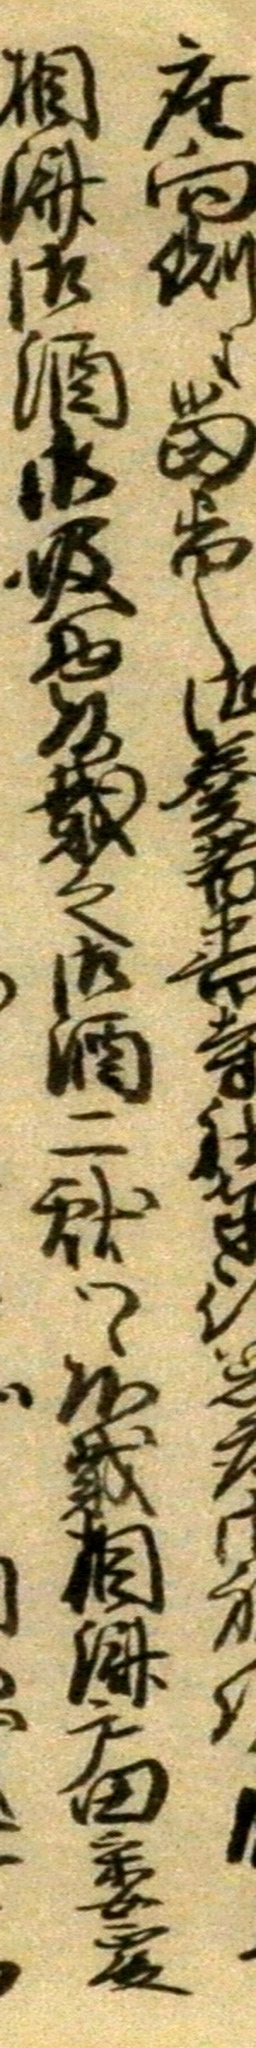相済御酒御吸物頂戴之御酒二献ツヽ頂戴相済戸田采女正殿
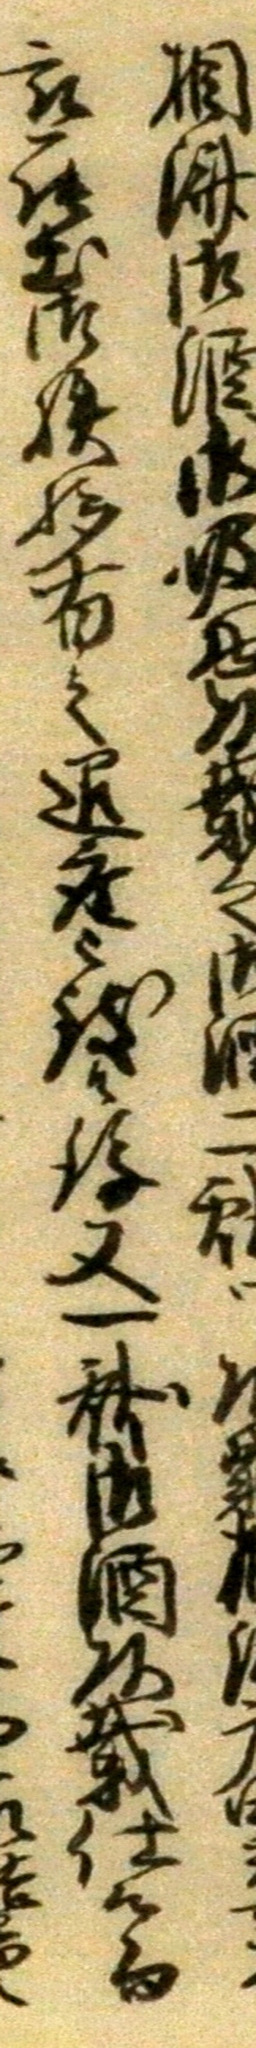被罷出御挨拶有之退座被致候後又一献御酒頂戴仕候而
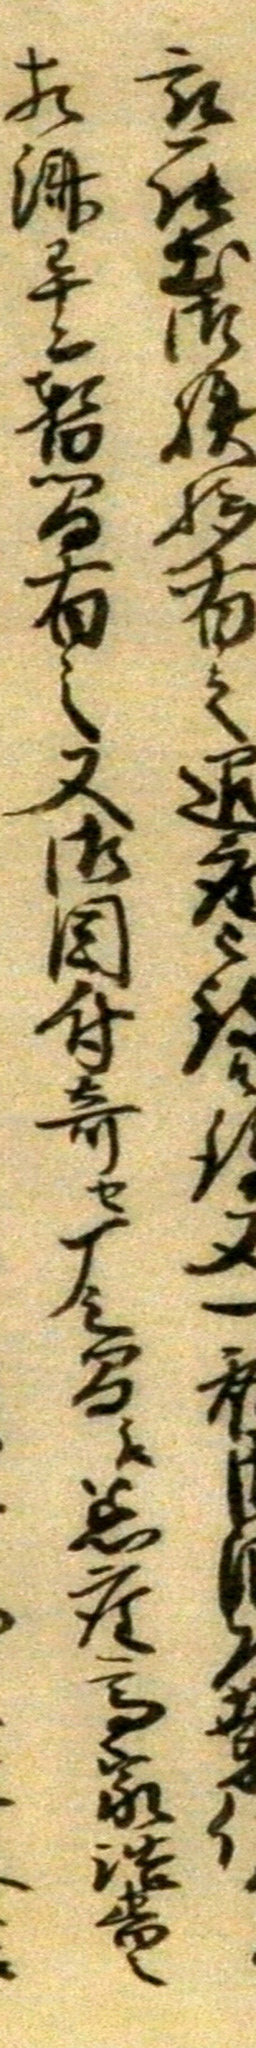相済畢而暫間有之又御目付寄セ雁之間え着座高家詰番之
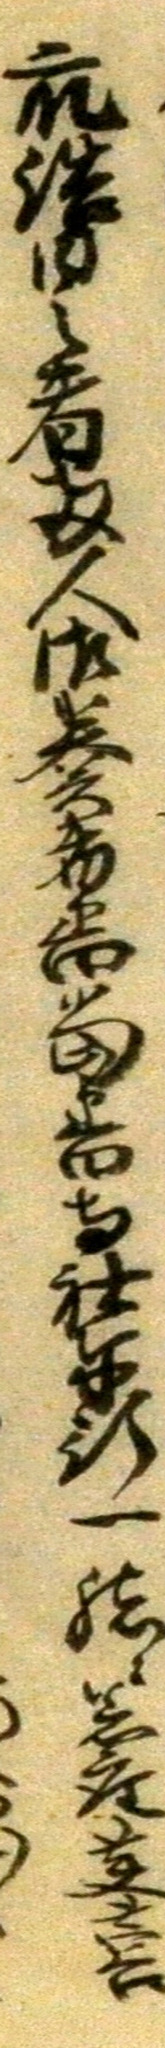衆詰日之者両人御奏者番当番寺社奉行一緒ニ着座芙蓉
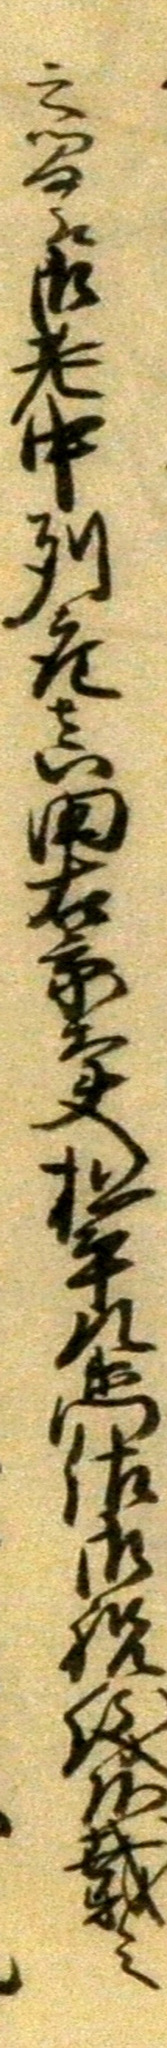之間え御老中列座真田右京大夫松平左衛門佐御祝儀頂戴之
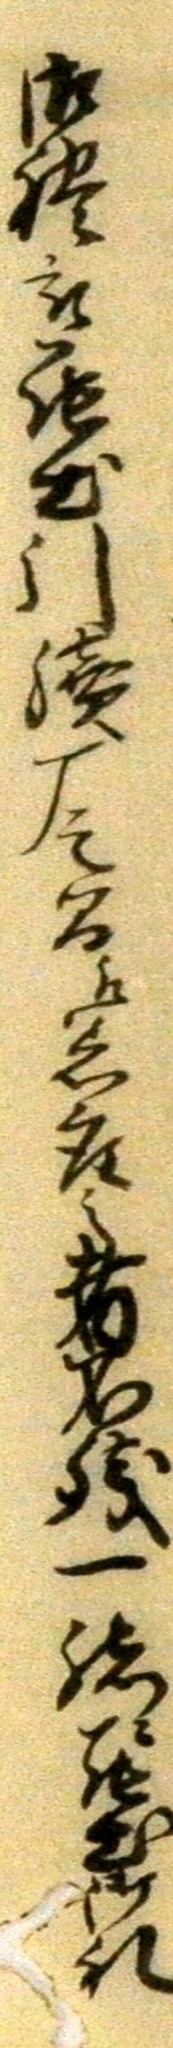御礼被罷出引続雁之間え着座之者不残一緒ニ罷出御礼
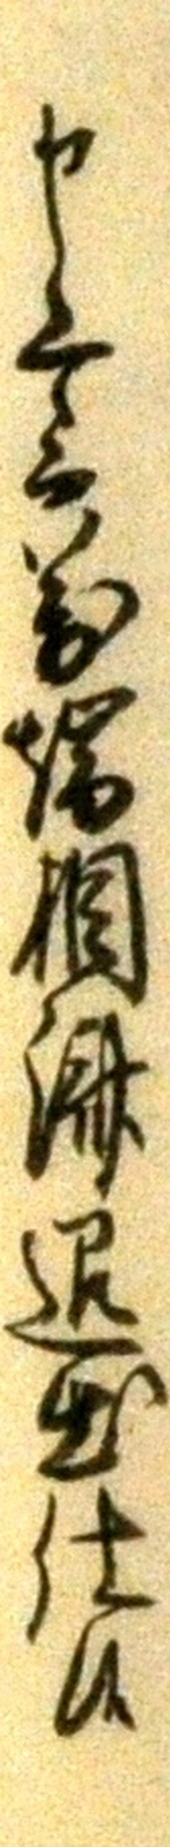申上候而万端相済退出仕候

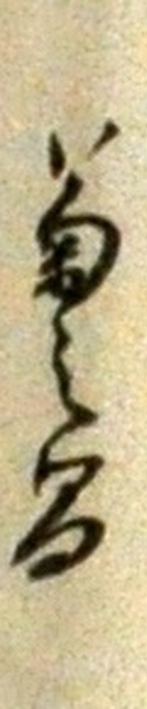菊之間
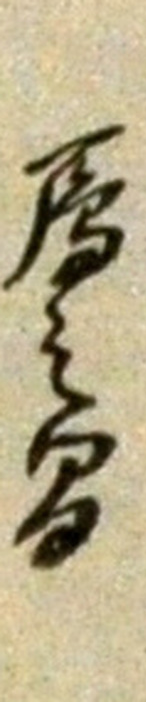雁之間
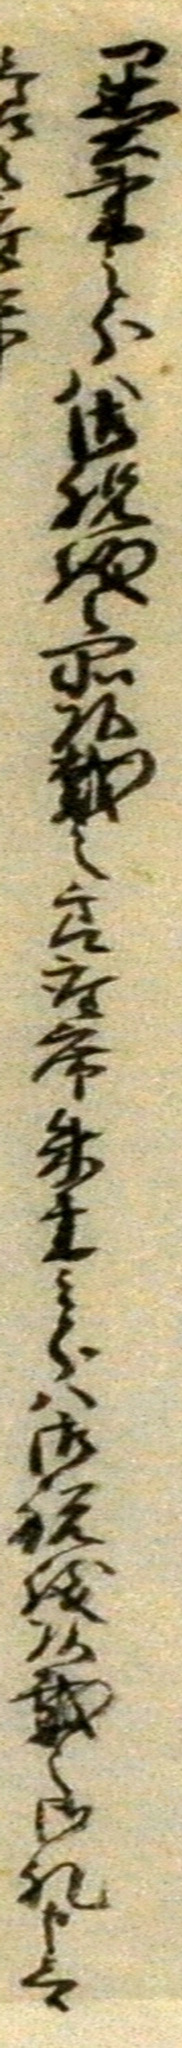墨書之分ハ御祝儀之品頂戴之節座席朱書之分ハ御祝儀頂戴之御礼申上候

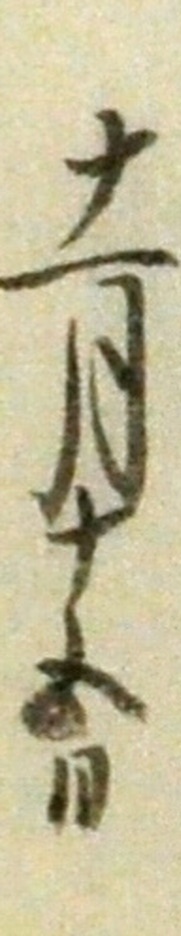十一月十五日
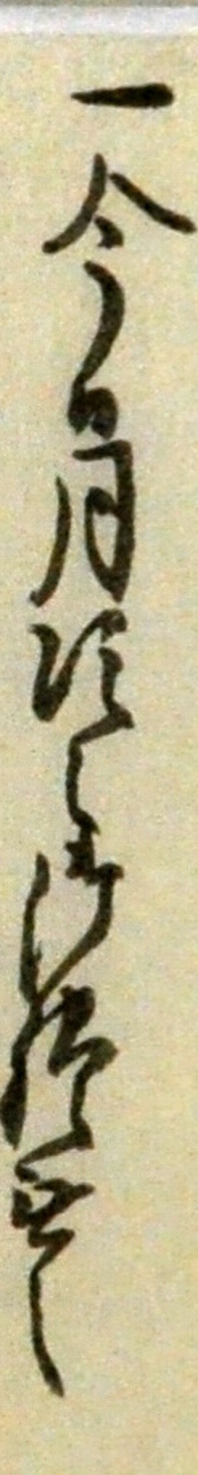一今日月次之御礼無之
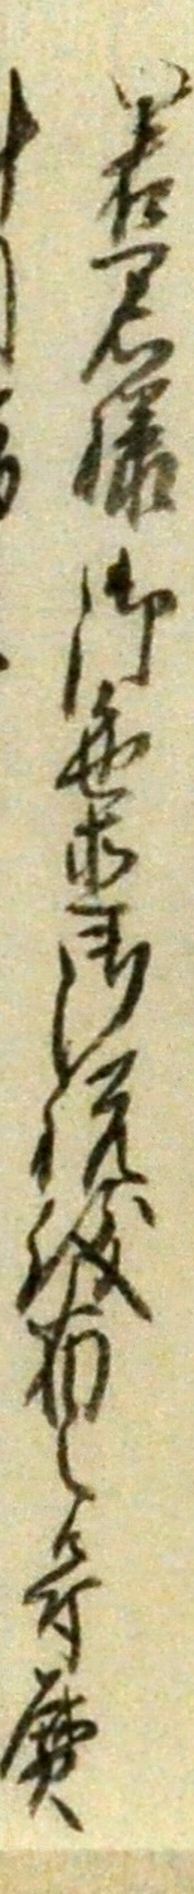若君様御色直御祝儀有之候付熨
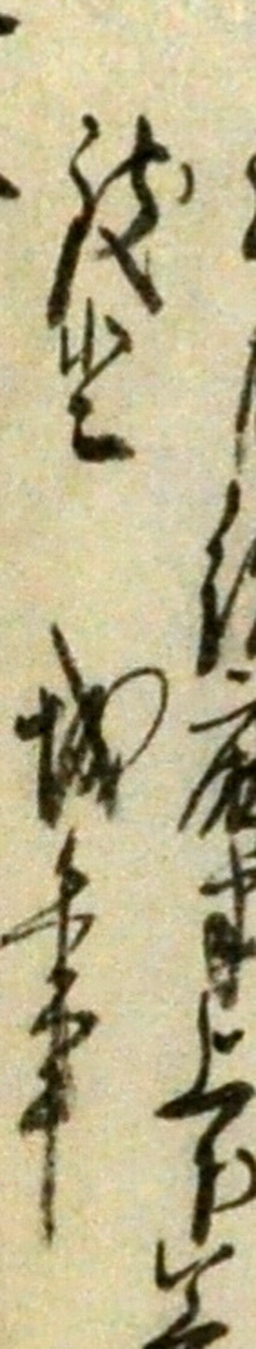致登城候事
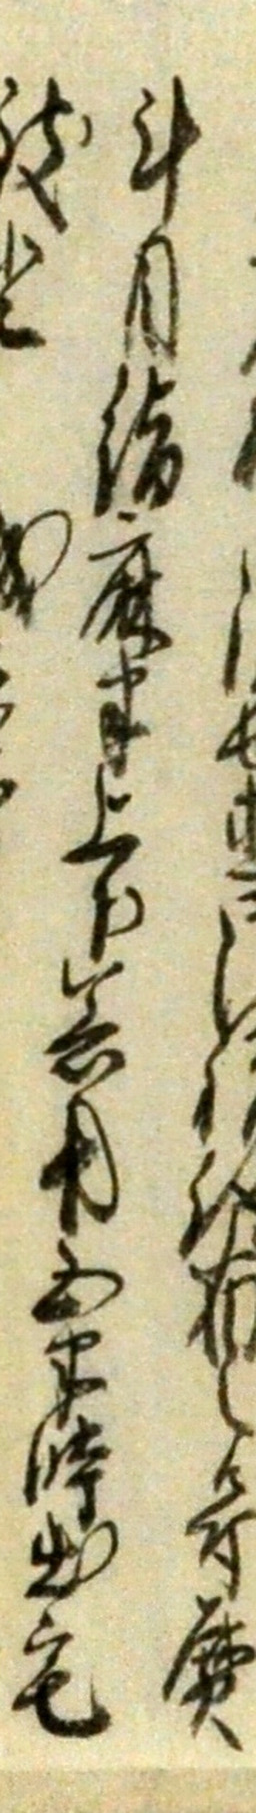斗目絹麻半上下着用五半時出宅
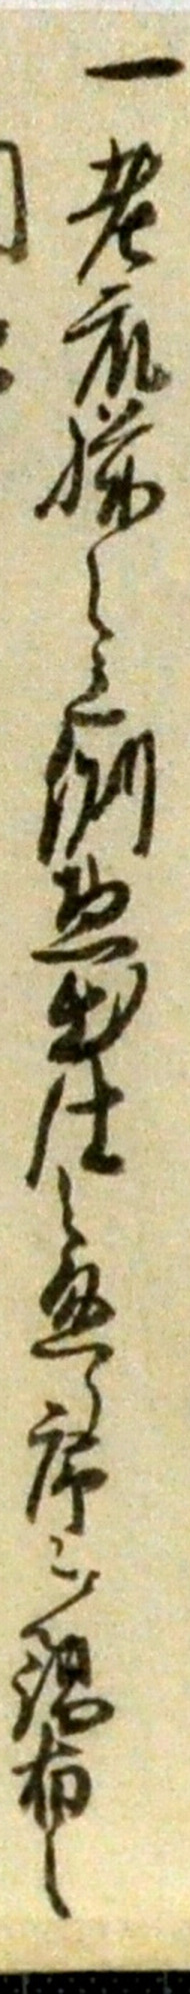一老衆揃之上例惣出仕之通り席々ニて謁有之
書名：若君様御色直御祝儀ノ節ノ留
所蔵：伊那市立高遠町図書館・合同会社AMANE
